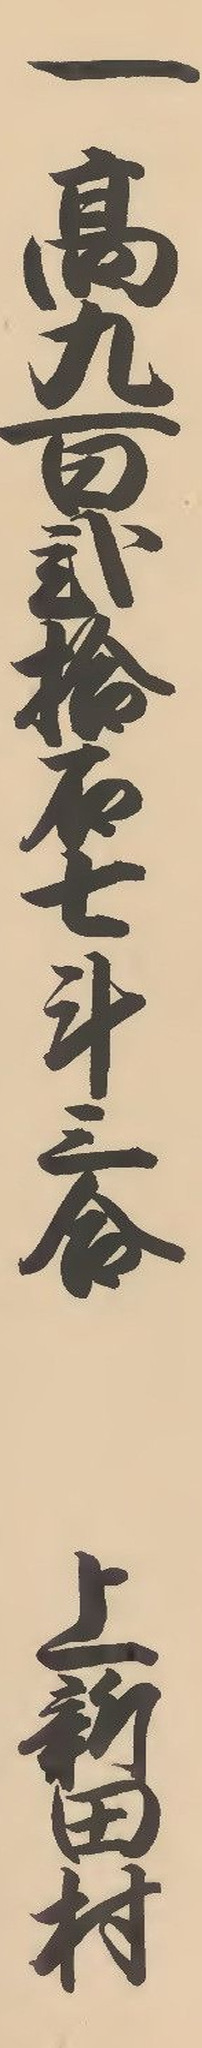一髙九百弐拾石七斗三合上新田村
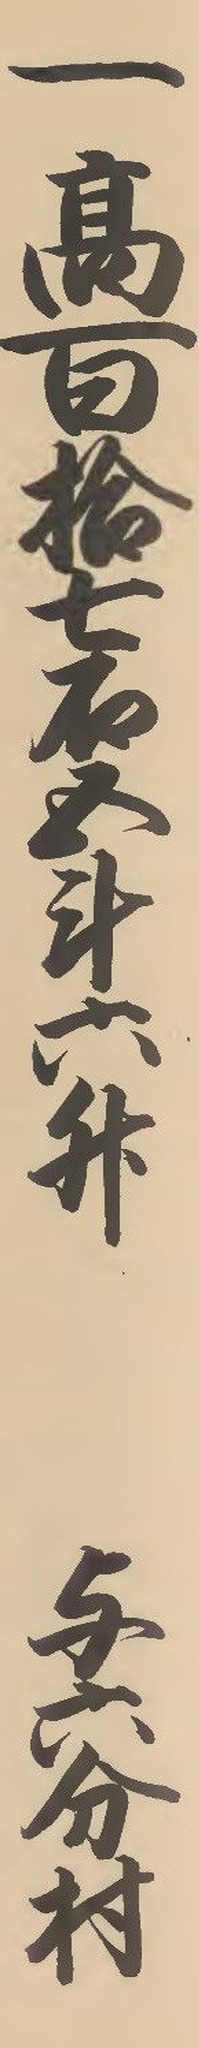一髙百拾七石五斗六升与六分村
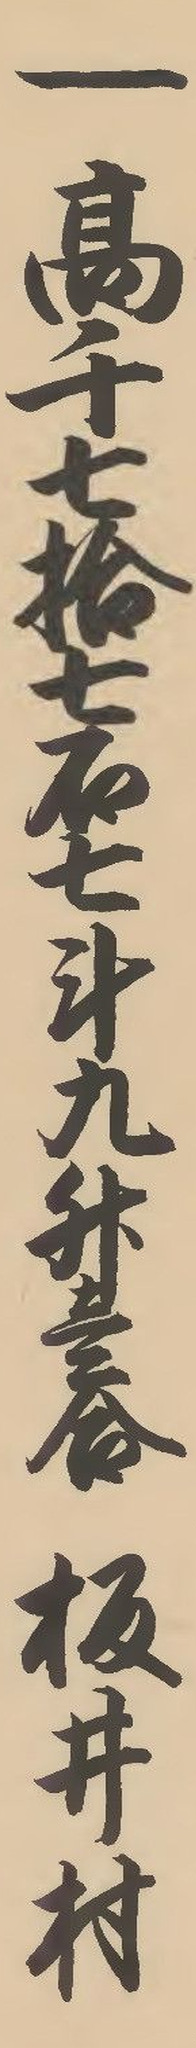一髙千七拾七石七斗九升壱合板井村
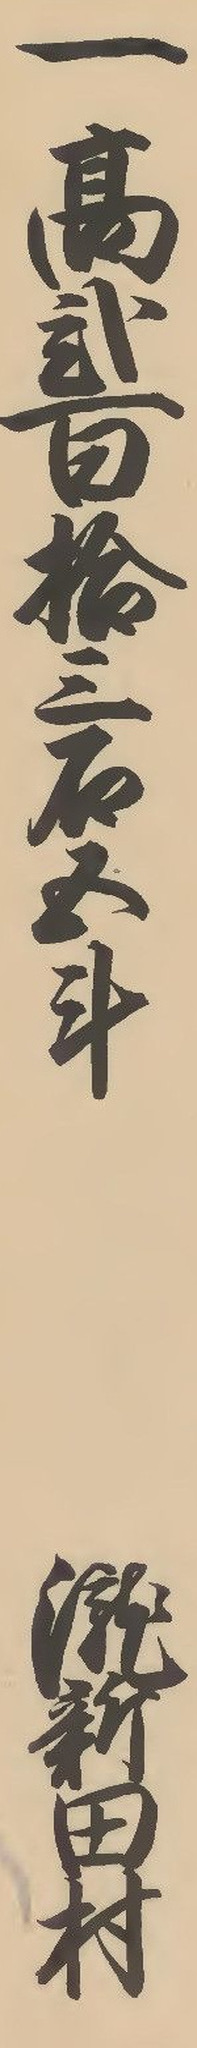一髙弐百拾三石五斗瀧新田村

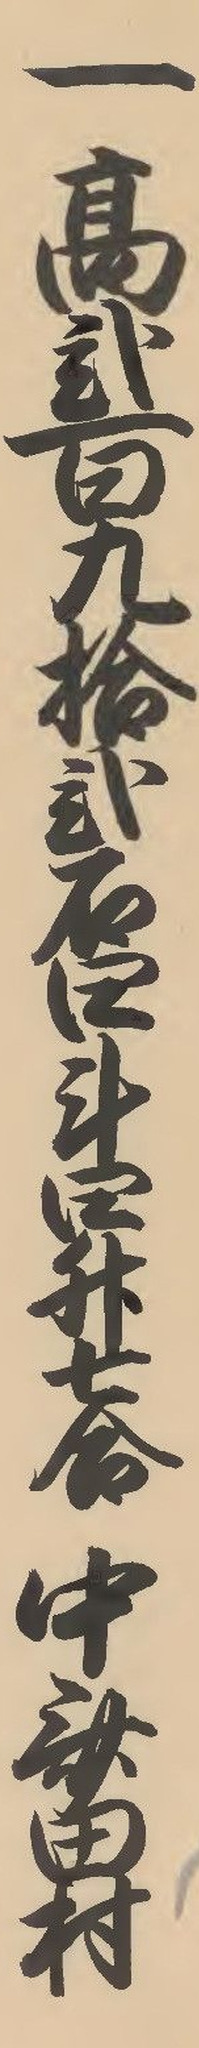一髙弐百九拾弐石四斗四升七合中齋田村
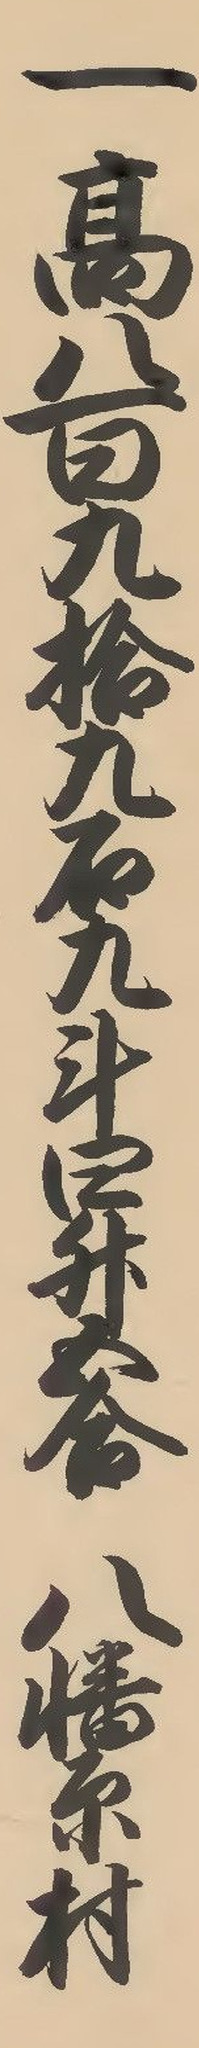一髙八百九拾九石九斗四升五合八幡原村
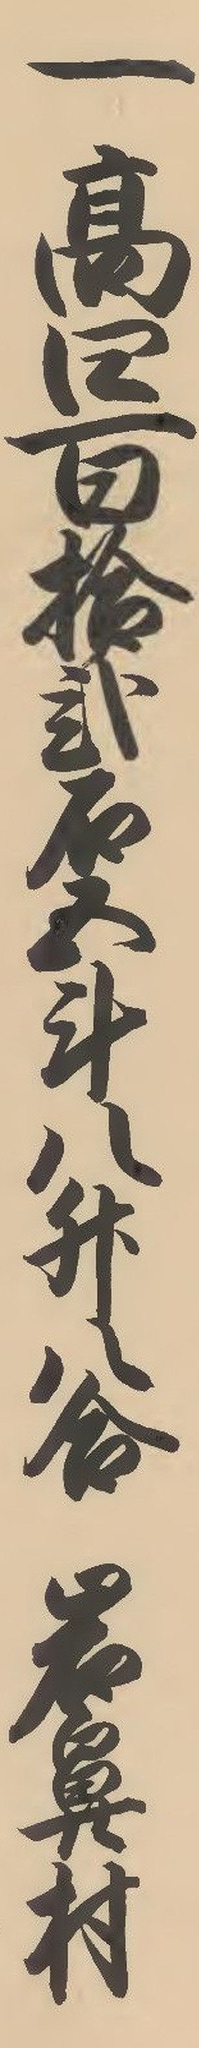一髙四百拾弐石五斗八升八合岩鼻村
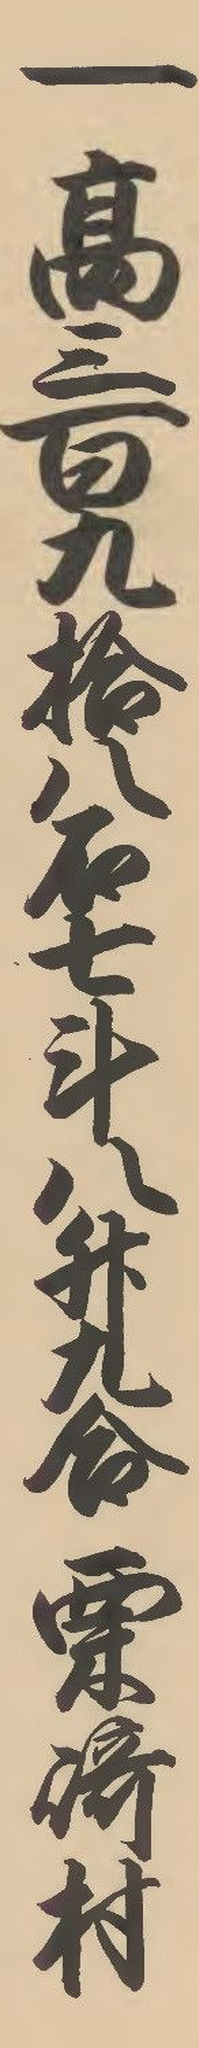一髙三百九拾八石七斗八升九合栗崎村
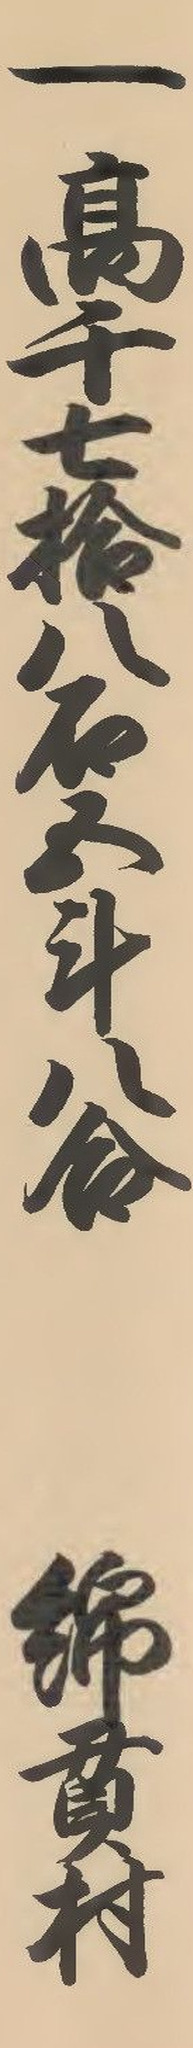一髙千七拾八石五斗八合綿貫村
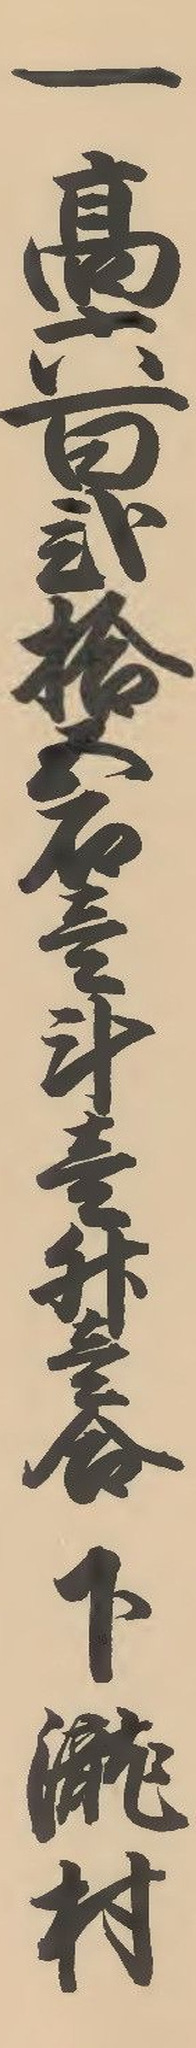一髙六百弐拾五石壱斗壱升壱合下瀧村
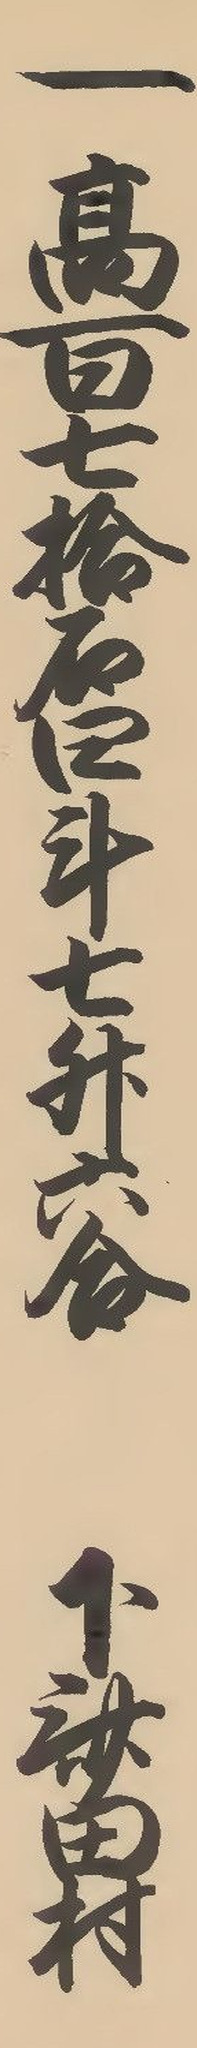一髙百七拾石四斗七升六合下齋田村
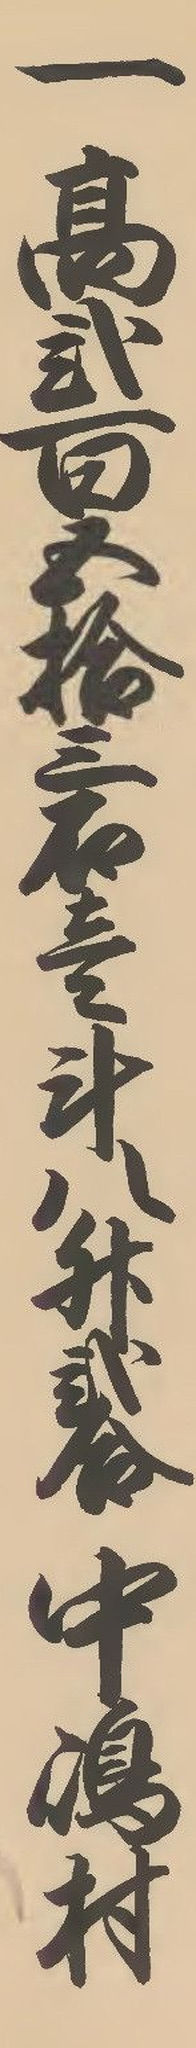一髙弐百五拾三石壱斗八升弐合中嶋村

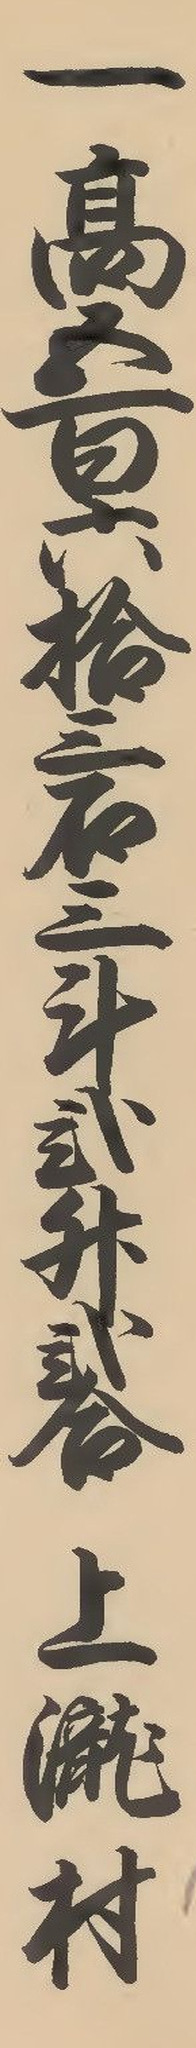一髙五百六拾三石三斗弐升弐合上瀧村
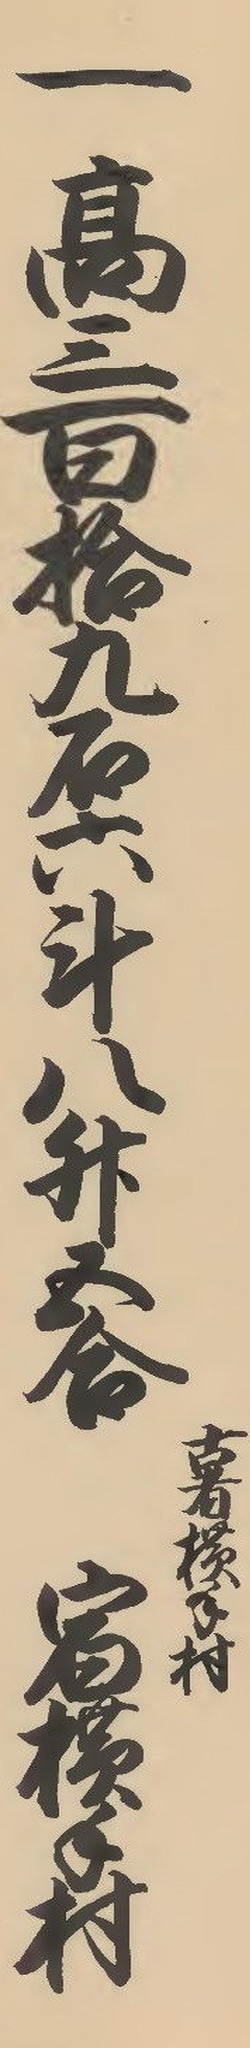一髙三百拾九石六斗八升五合宿横手村
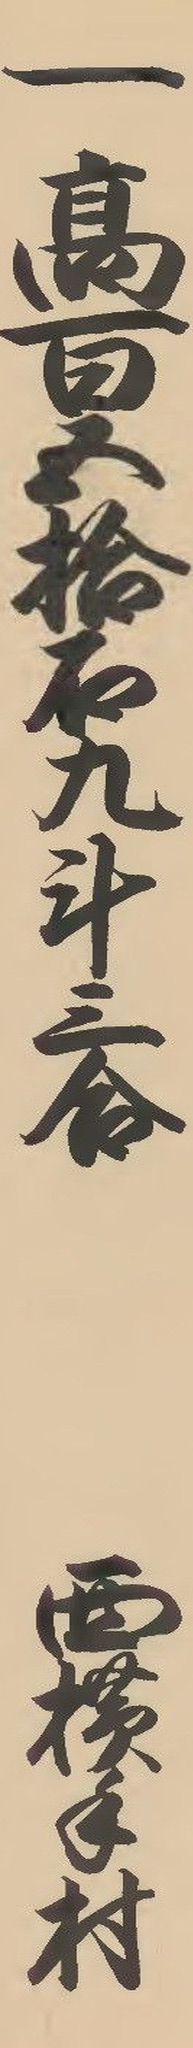一髙百五拾石九斗三合西横手村
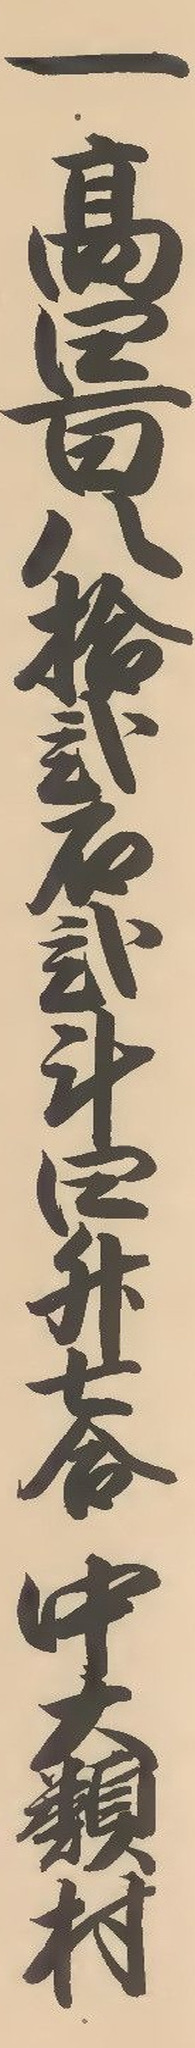一髙四百八拾弐石弐斗四升七合中大類村
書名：上野国郷帳
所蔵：国立公文書館 National Archives of Japan
